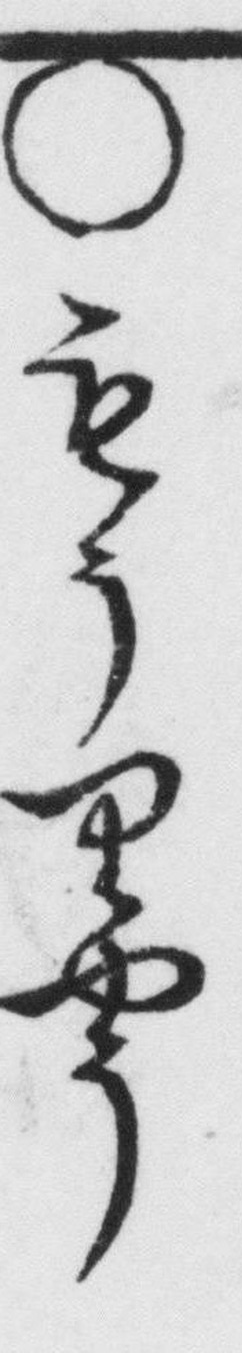○もうりやう
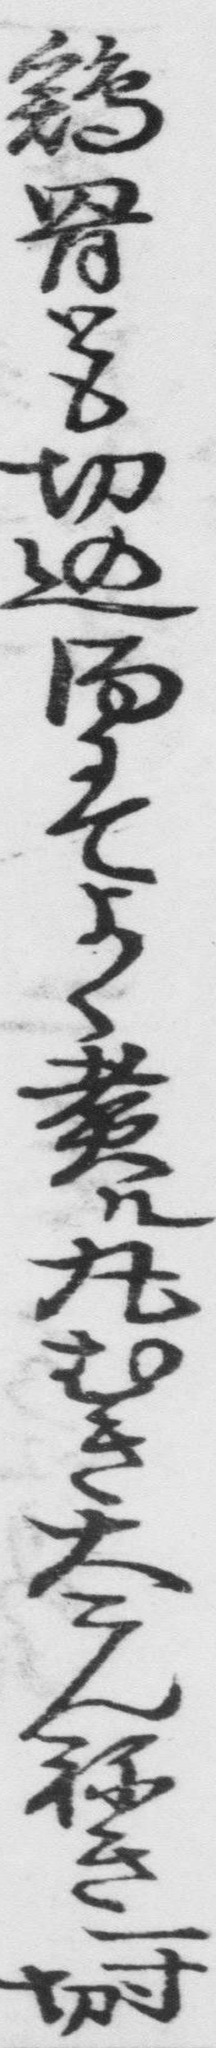鶏骨とも切込酒にてよく煮る丸むき大こんねき一寸切

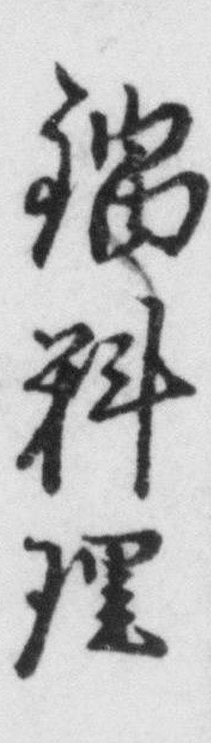鍋料理
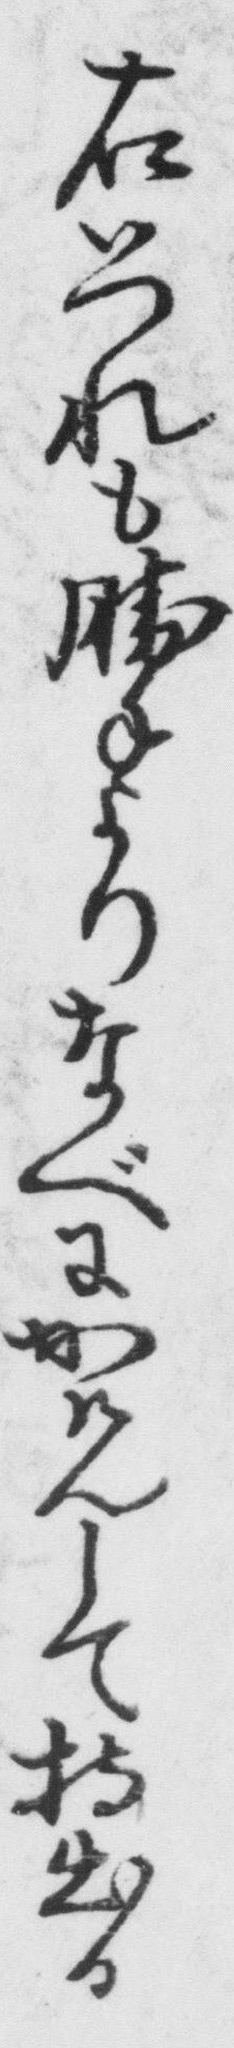右いつれも勝手よりなべにかけんして持出る
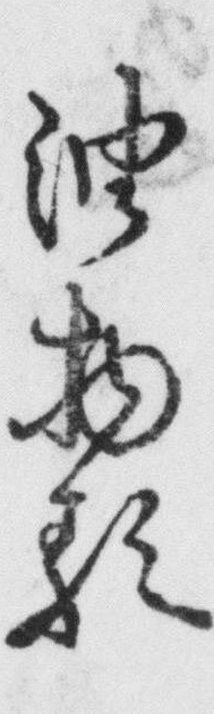油物類
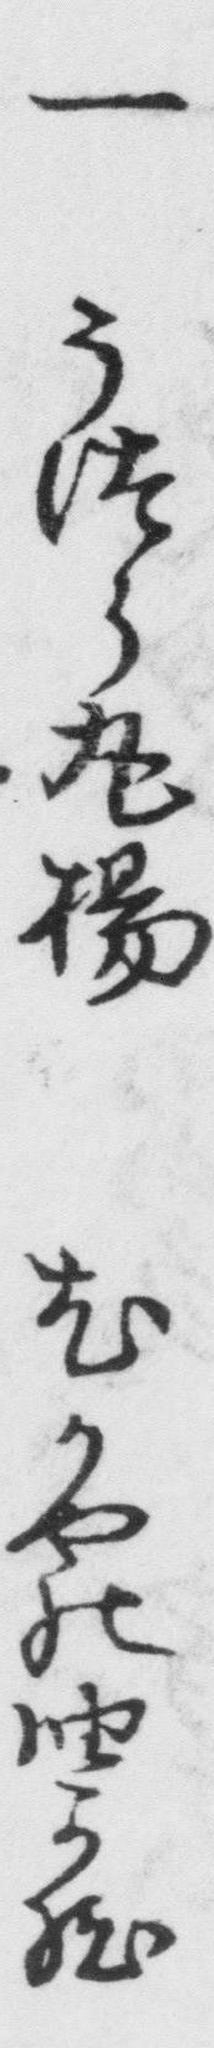一うつら丸揚尤かやの油に然
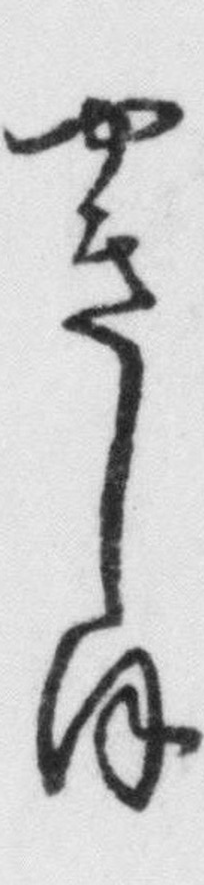やきしほ
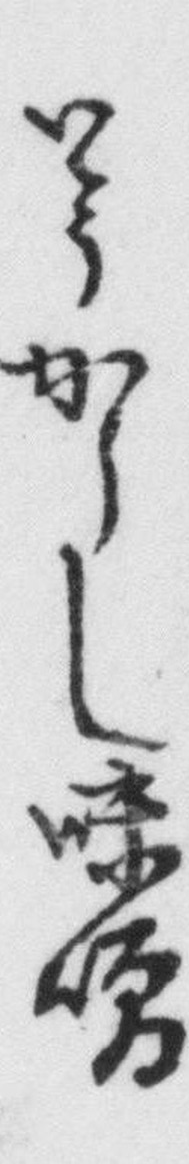とうからし味噌
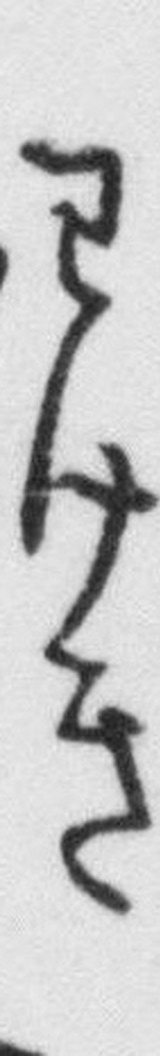わけき
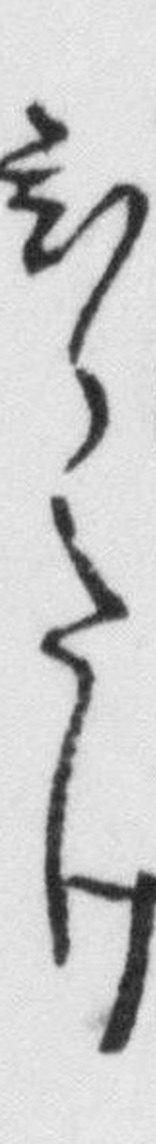ひらたけ

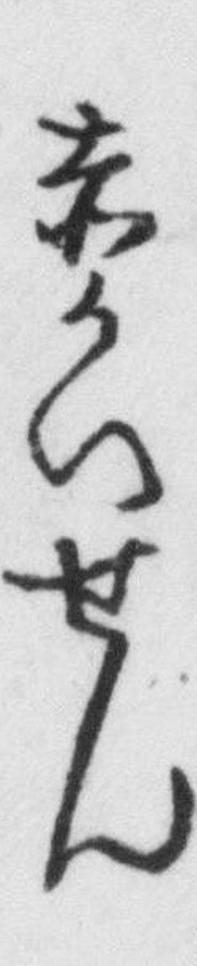赤かいせん
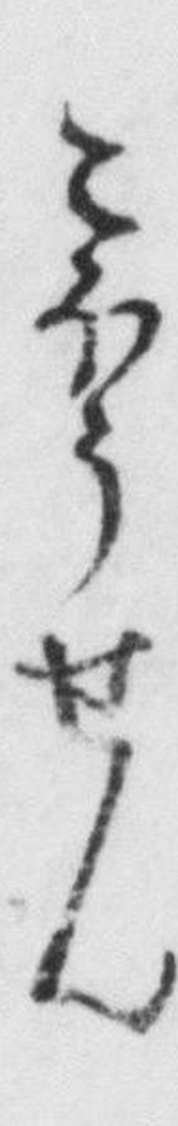こほうせん
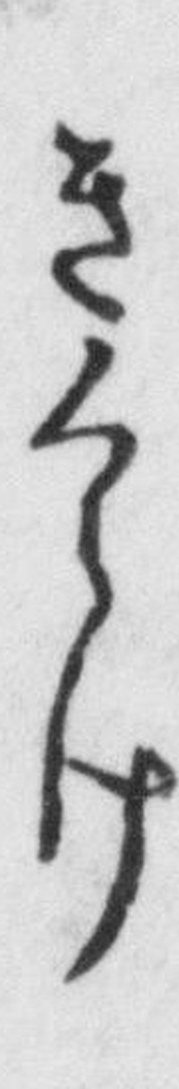きくらけ
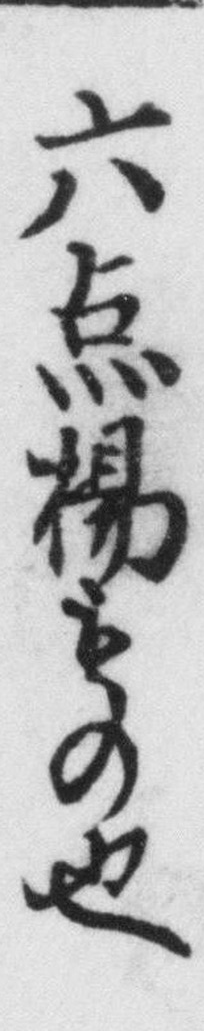六点揚もの也
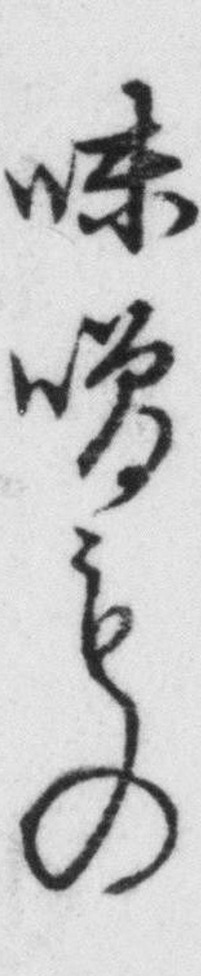味噌もの
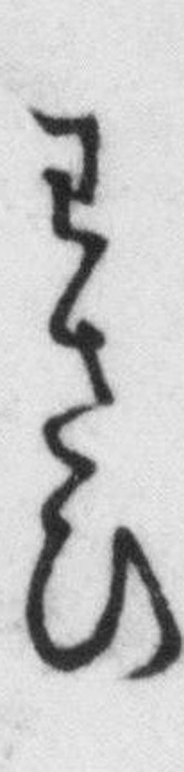わさひ
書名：卓子料理仕様
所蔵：大阪府立大学学術情報センター 国文学研究資料館
